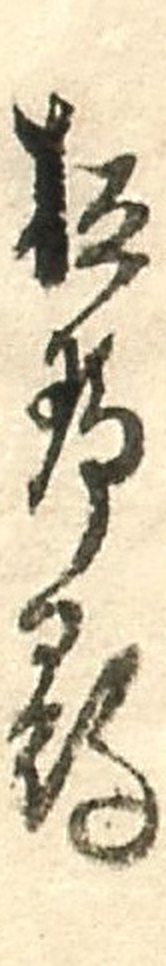板野郡
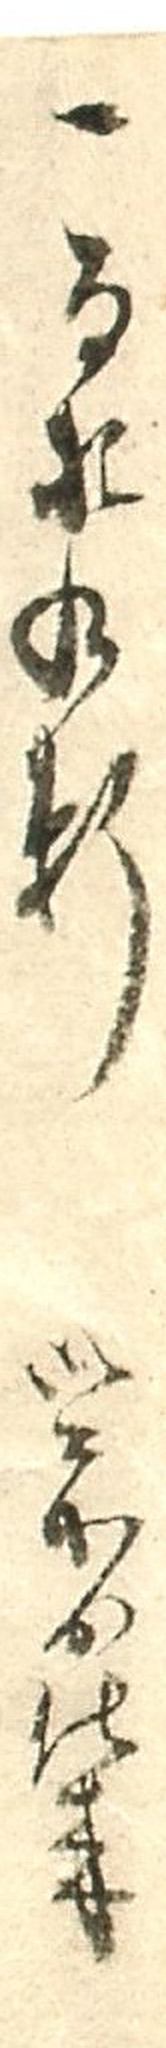一百十九軒以前より仕来
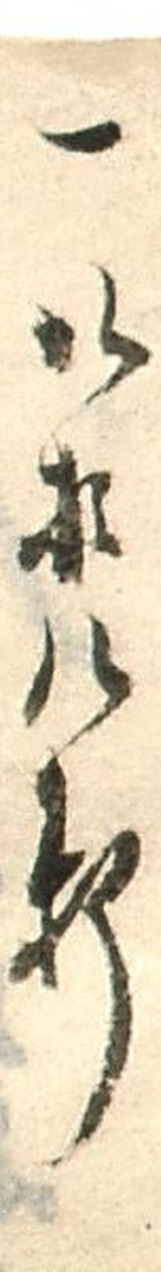〆四十八軒
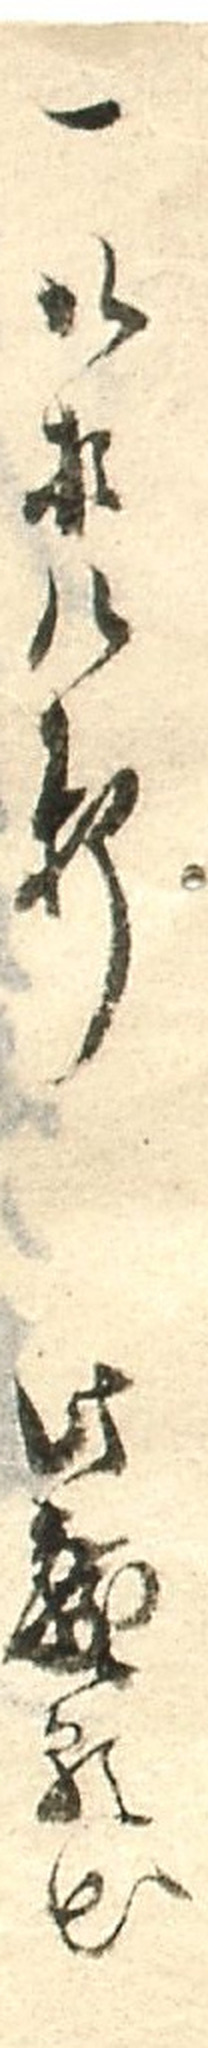一八十八軒此度願出
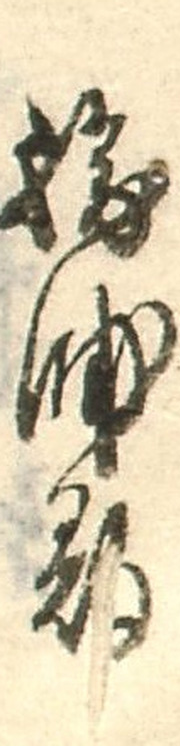勝浦郡
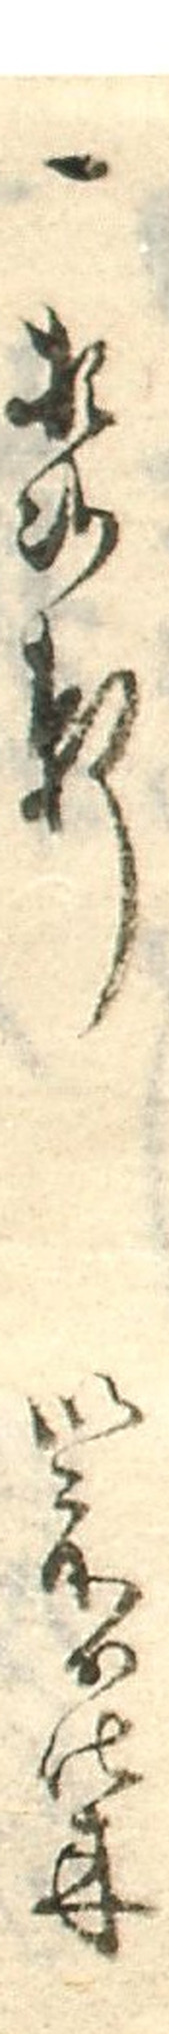一十二軒以前より仕来
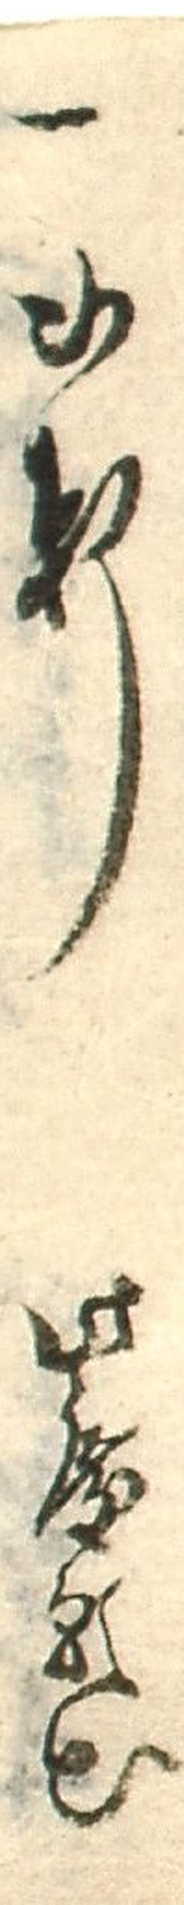一二軒此度願出
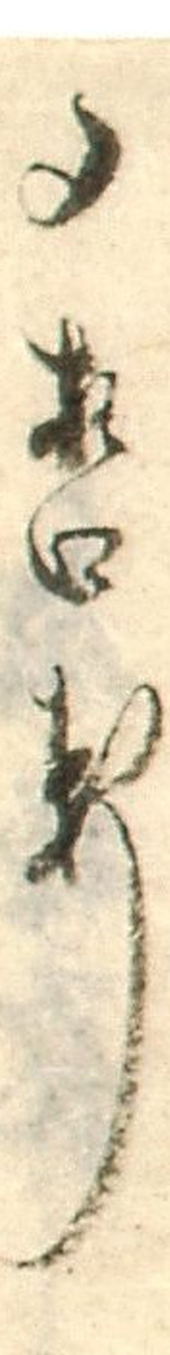〆十四軒
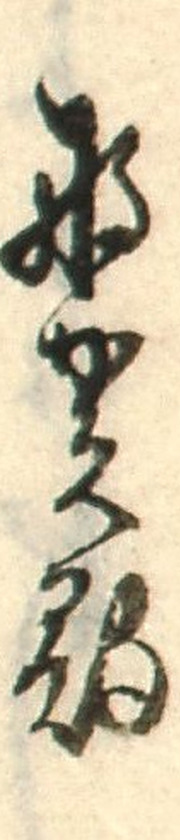那賀郡
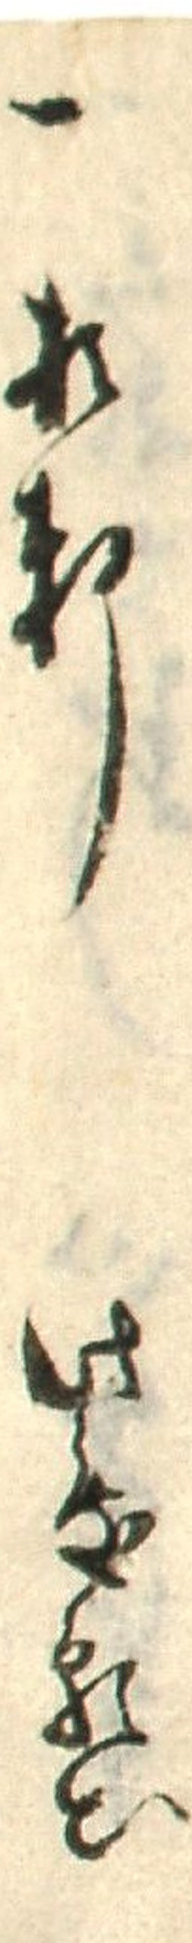一二軒此度願出

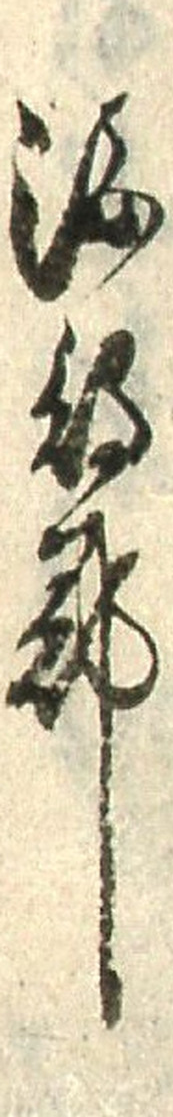海部郡
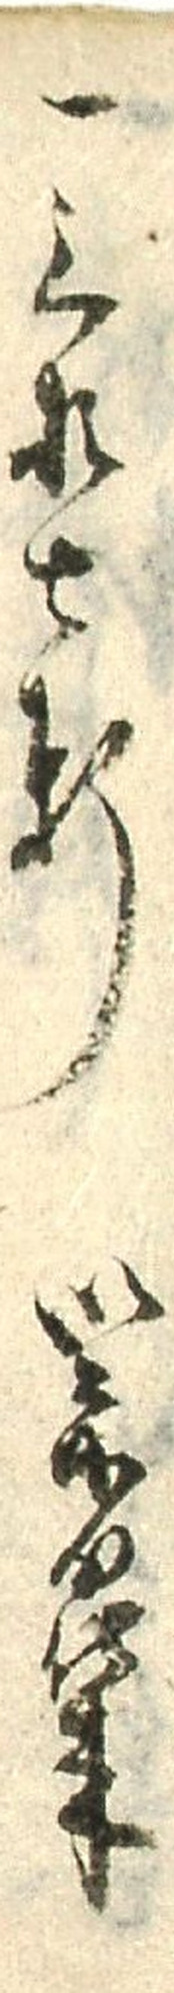一三十七軒以前より仕来
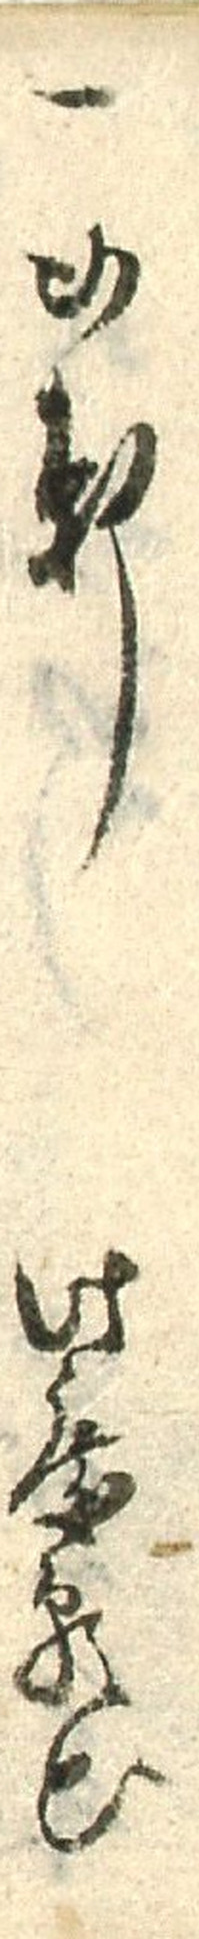一二軒此度願出
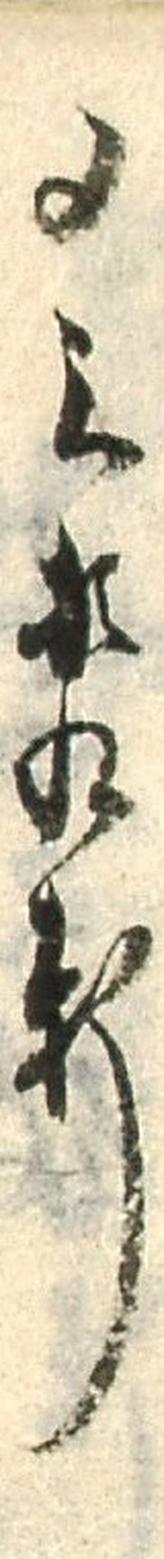〆三十九軒
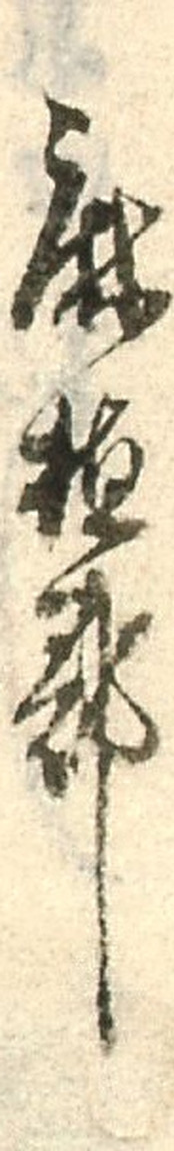麻植郡
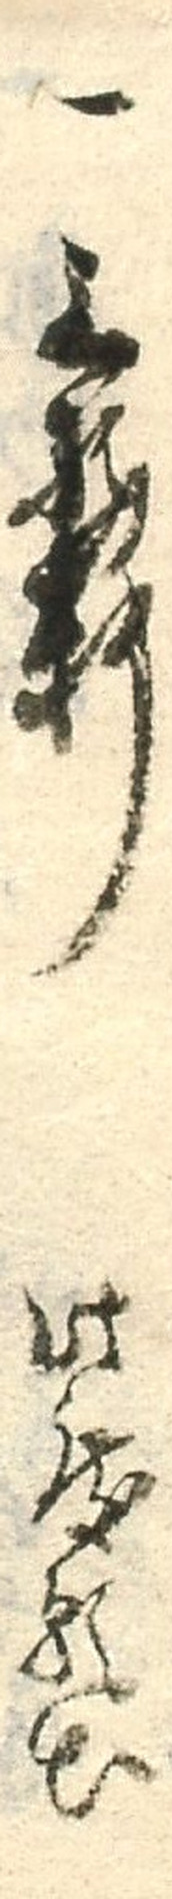一三十軒此度願出
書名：郷酒株絞油株質屋株御取窮郡中名面帳並諸郡株数相改帳
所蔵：鳴門教育大学 Naruto University of Education
